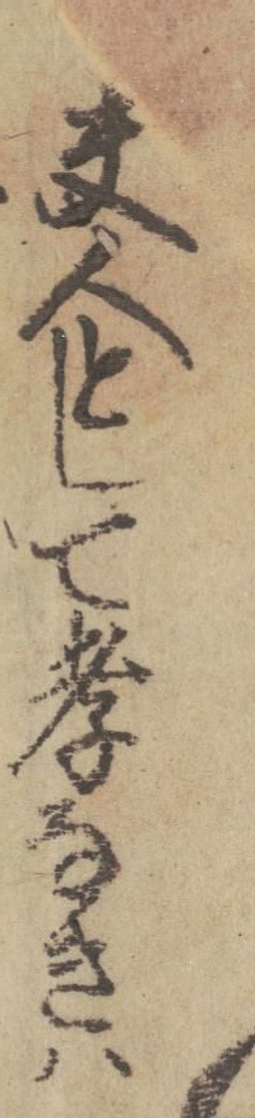夫人として孝なきは
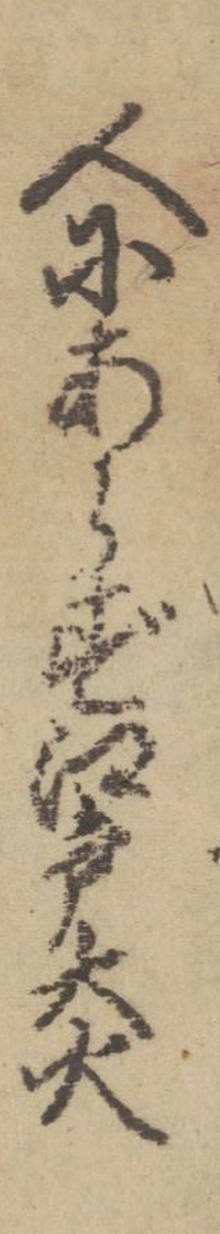人にあらず江戸大火
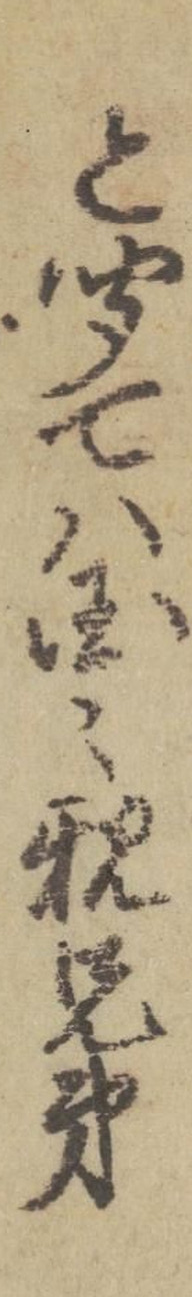と聞ては国々親兄弟
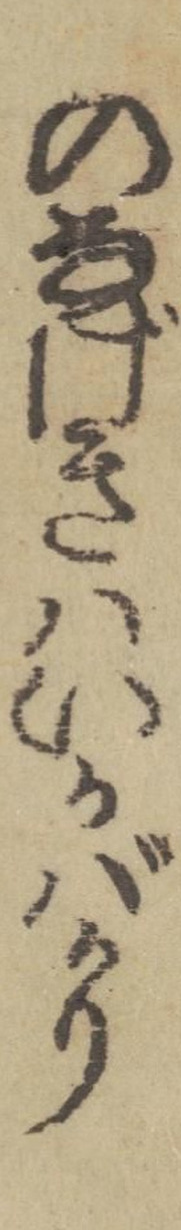のなげきはいかばかり
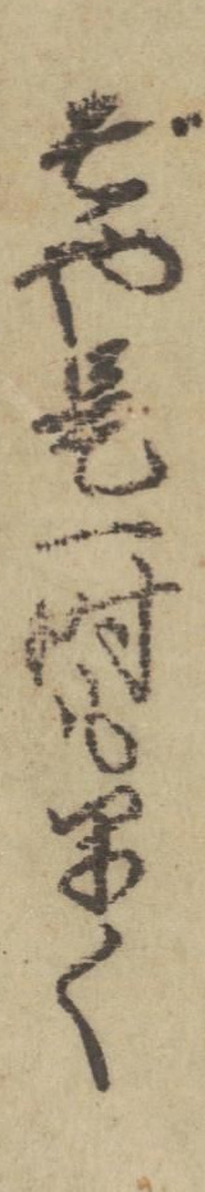ぞや是一時も早く
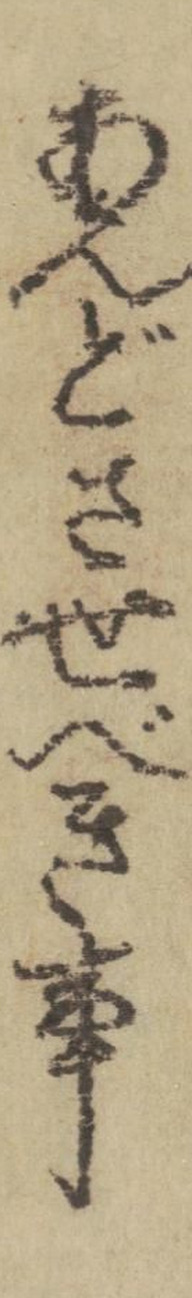あんぴさせべき事
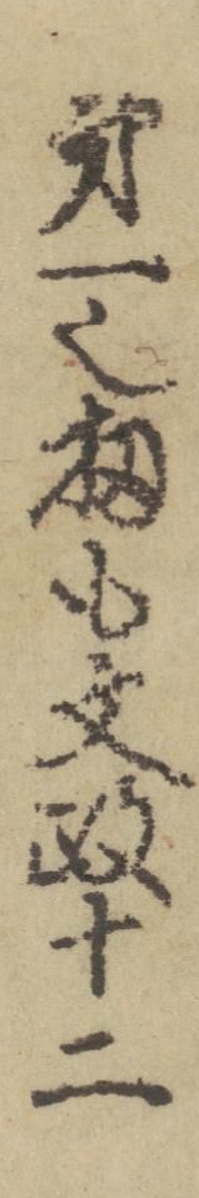第一也扨も文政十二
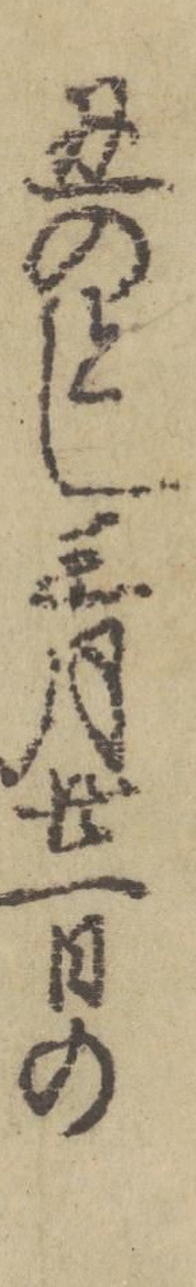丑のとし三月廿一日の
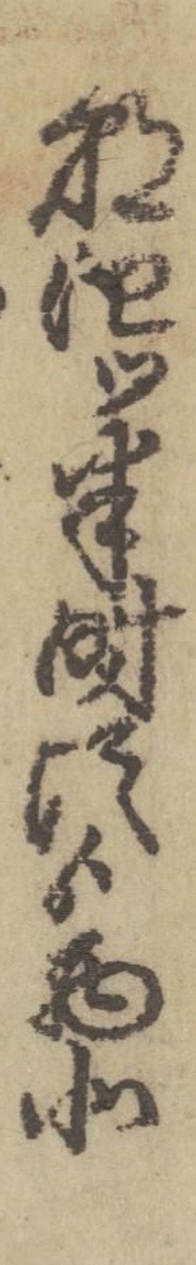朝四ッ半時頃ゟ西北
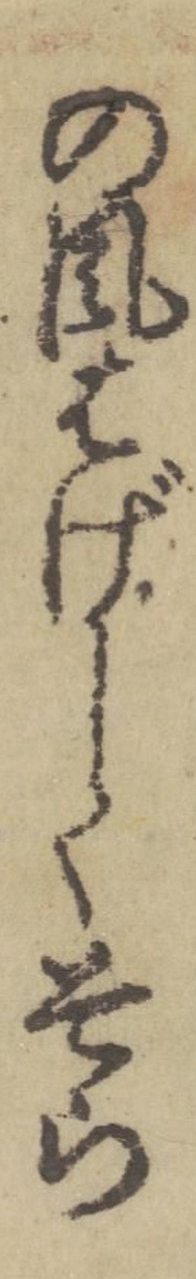の風はげしくそら
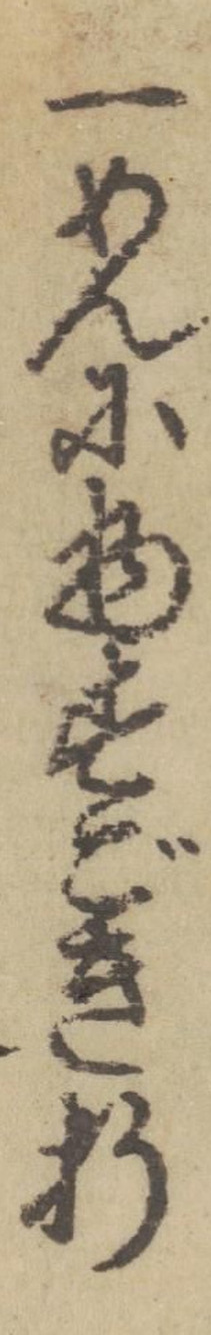一めんに物すごき折
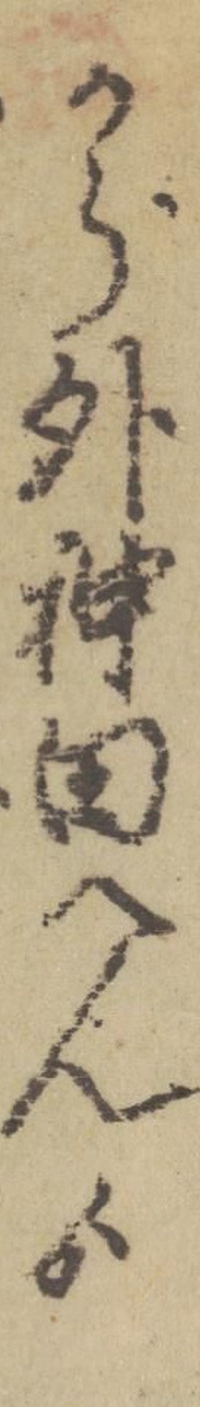から外神田へんゟ
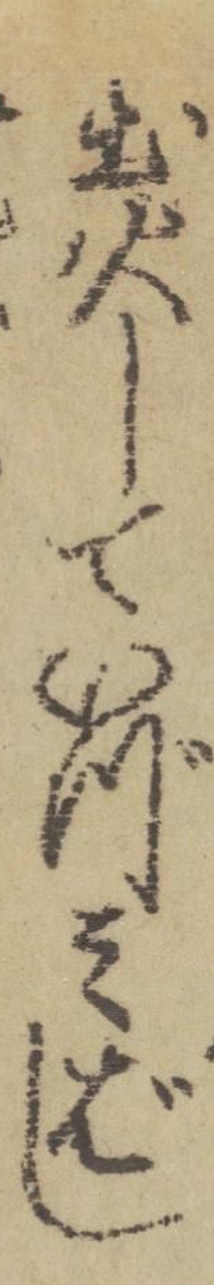出火していずみばし
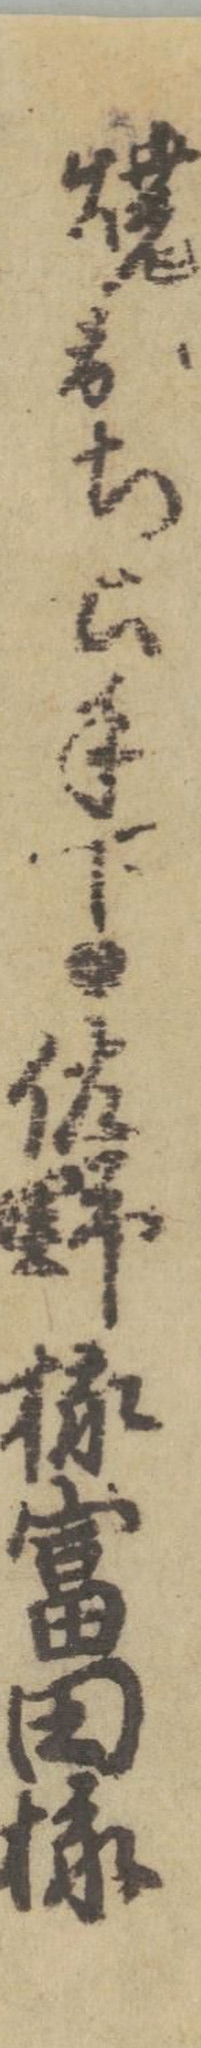焼おち土手下●佐野様富田様
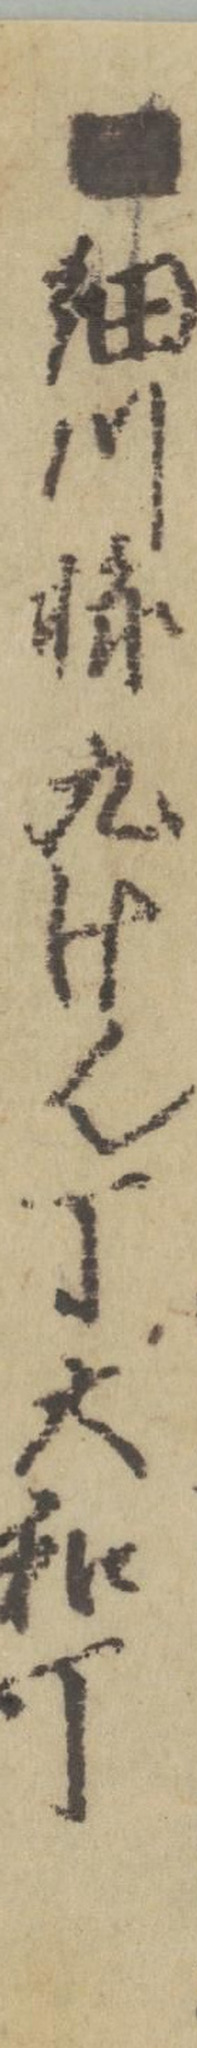細川様九けん丁大和丁
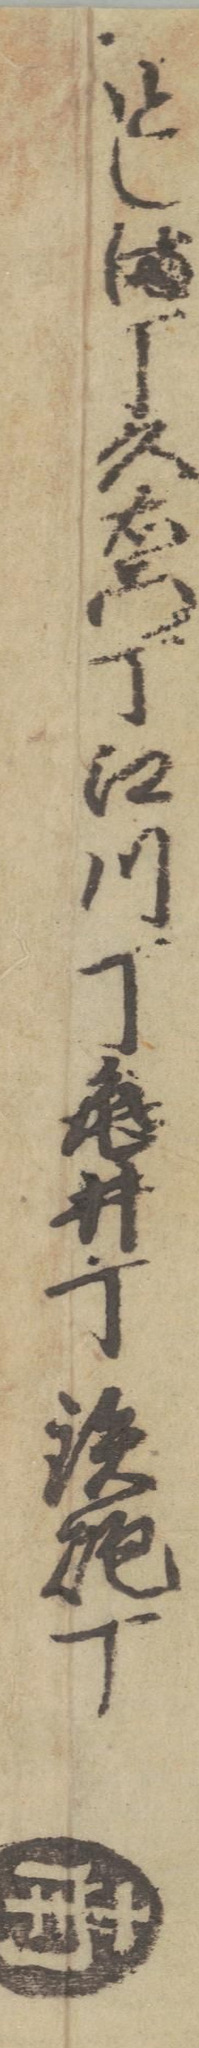としま丁久右衛門丁江川丁亀井丁鉄炮丁
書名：方角場所附
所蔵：東京大学地震研究所図書室 Earthquake Research Institute Library, The University of Tokyo, JAPAN
